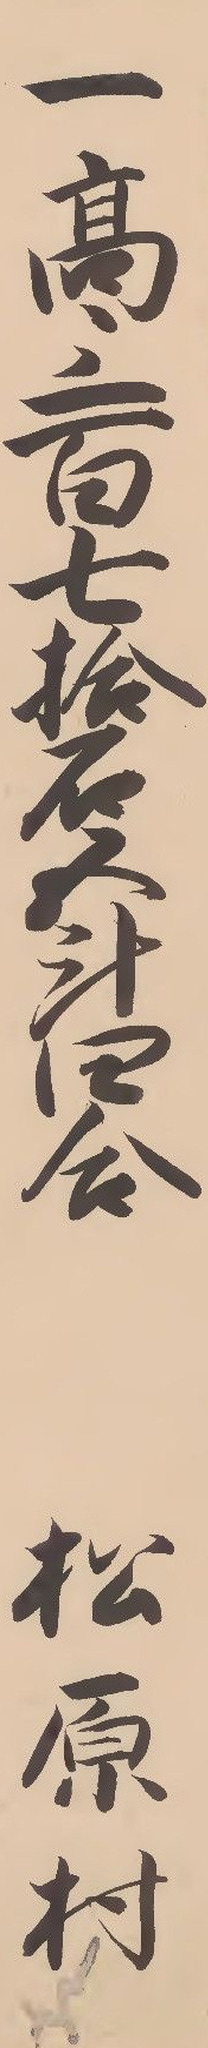一高三百七拾石五斗四合松原村
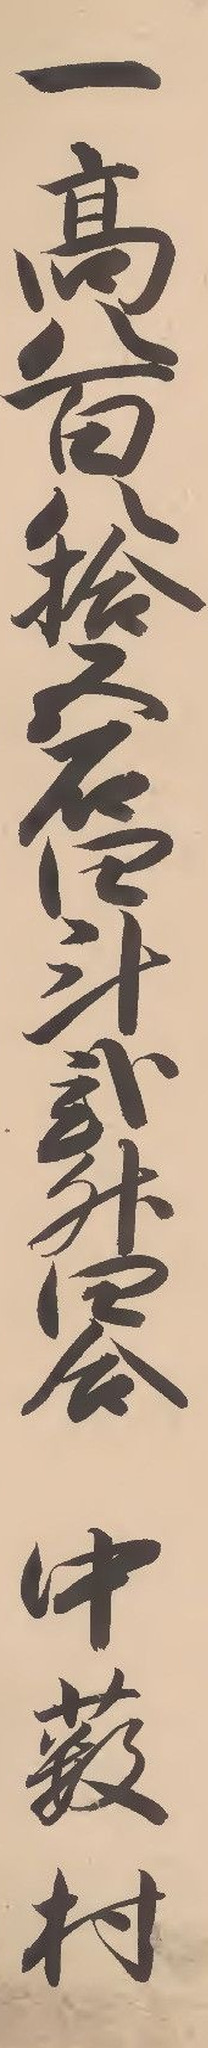一高八百八拾五石四斗弐升四合中薮村

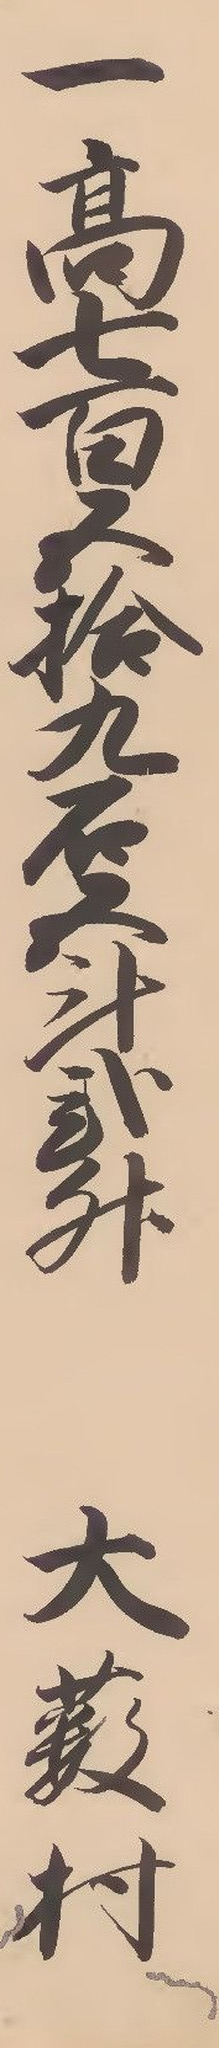一高七百五拾九石五斗弐升大薮村
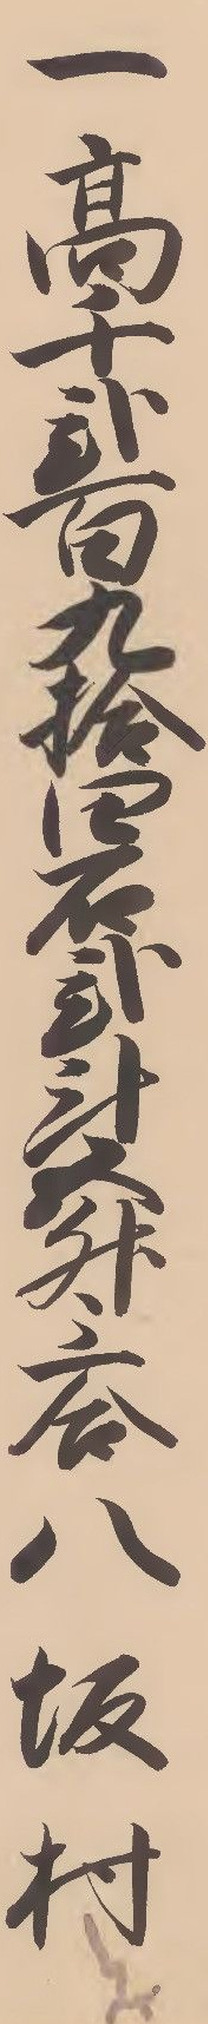一高千弐百九拾四石弐斗五升三合八坂村
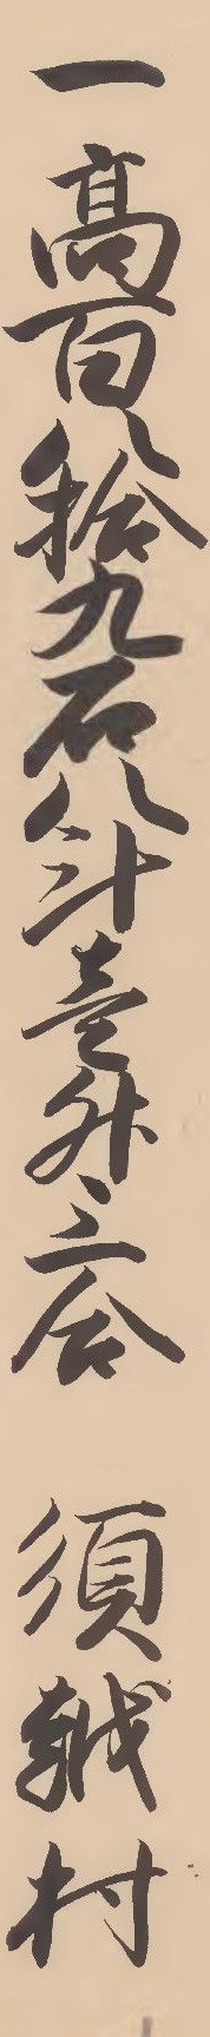一高百八拾九石八斗壱升三合須越村
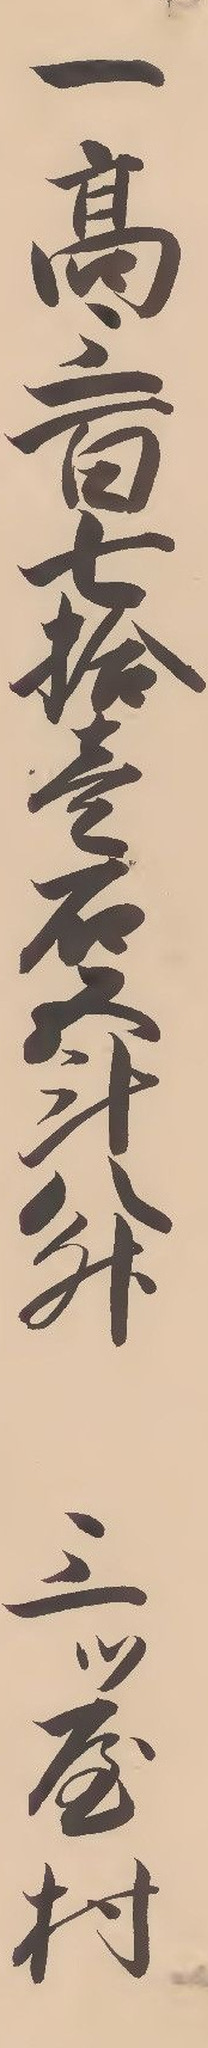一高三百七拾壱石五斗八升三ツ屋村
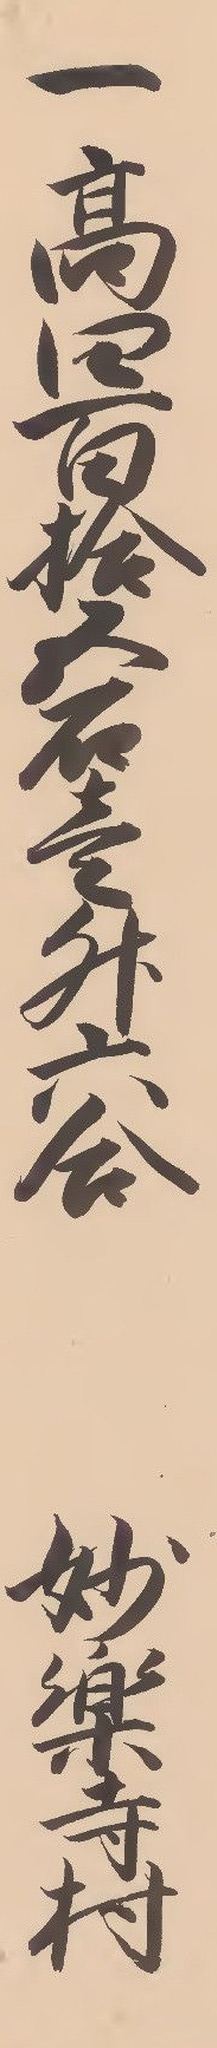一高四百拾五石壱升六合妙楽寺村
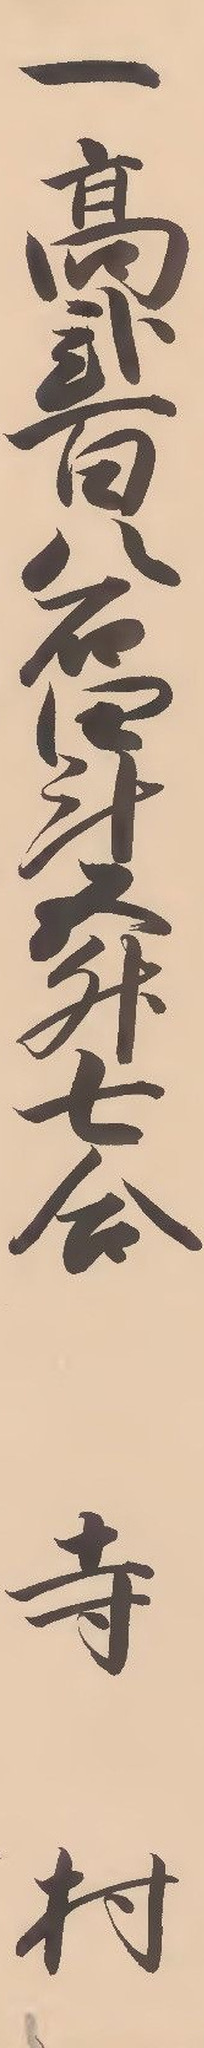一高弐百八石四斗五升七合寺村
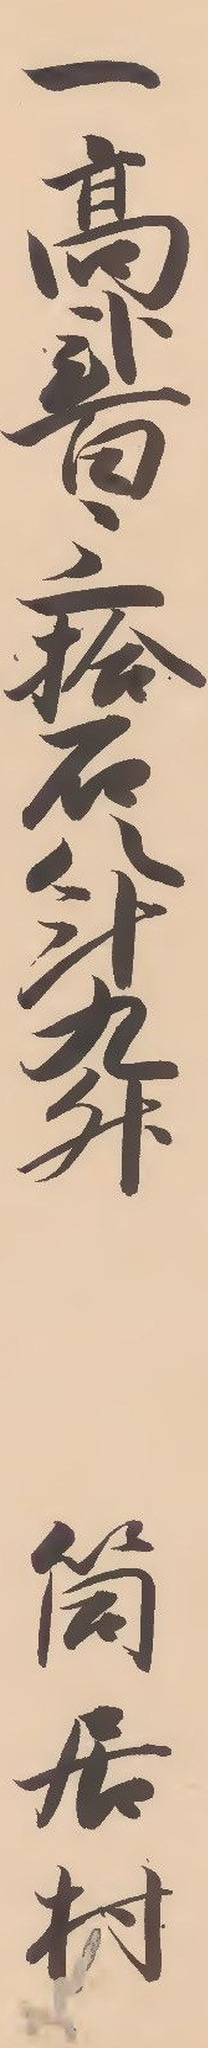一高弐百三拾石八斗九升筒居村
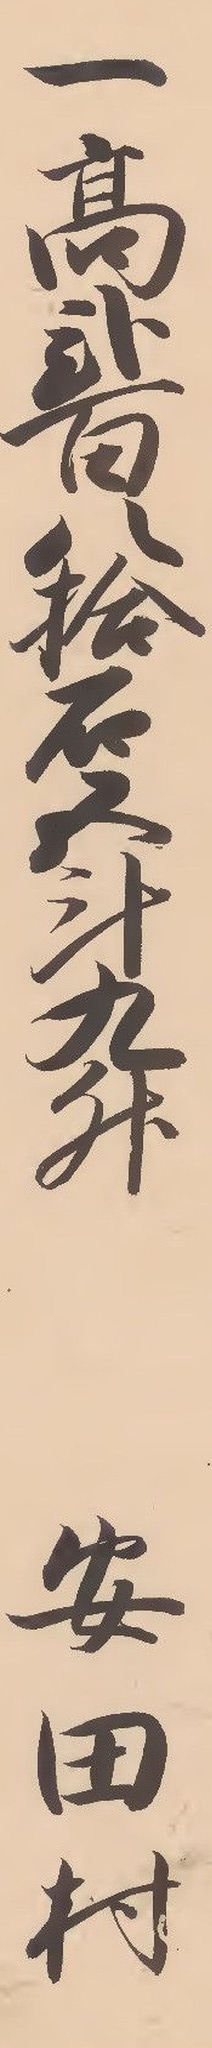一高弐百八拾石五斗九升安田村

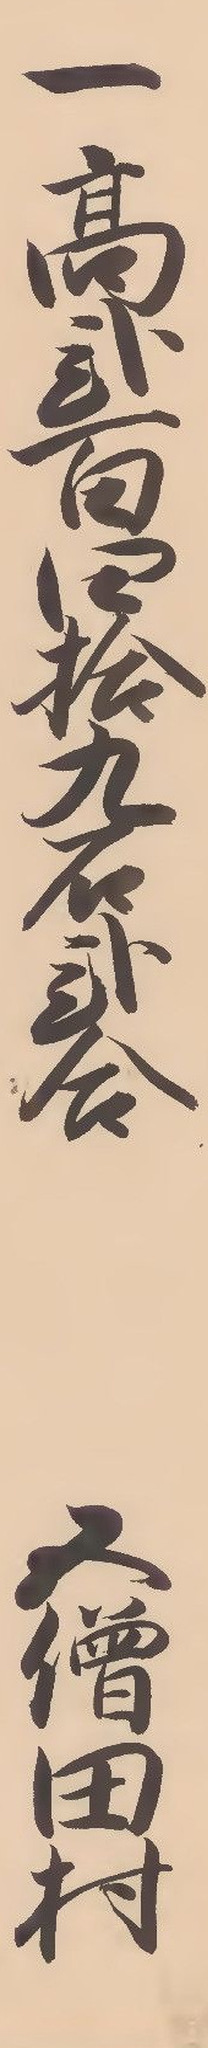一高弐百四拾九石弐合五僧田村
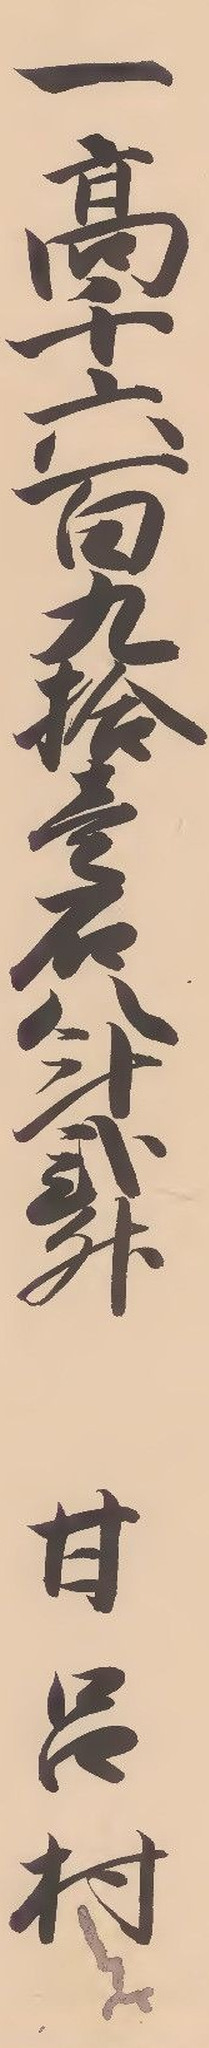一高千六百九拾壱石八斗弐升甘呂村
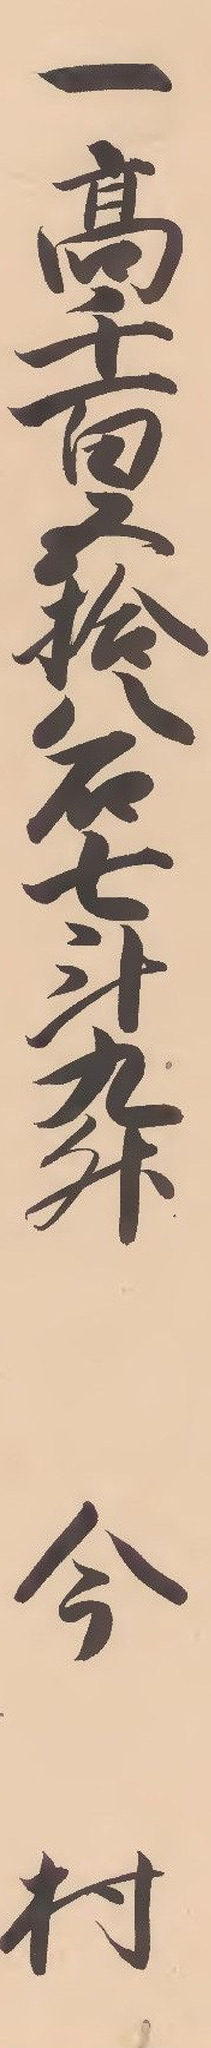一高千百五拾八石七斗九升今村
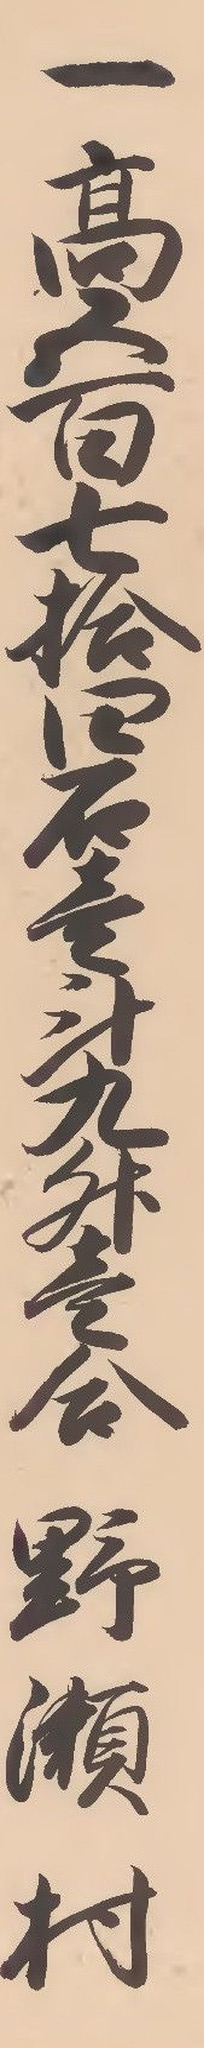一高五百七拾四石壱斗九升壱合野瀬村
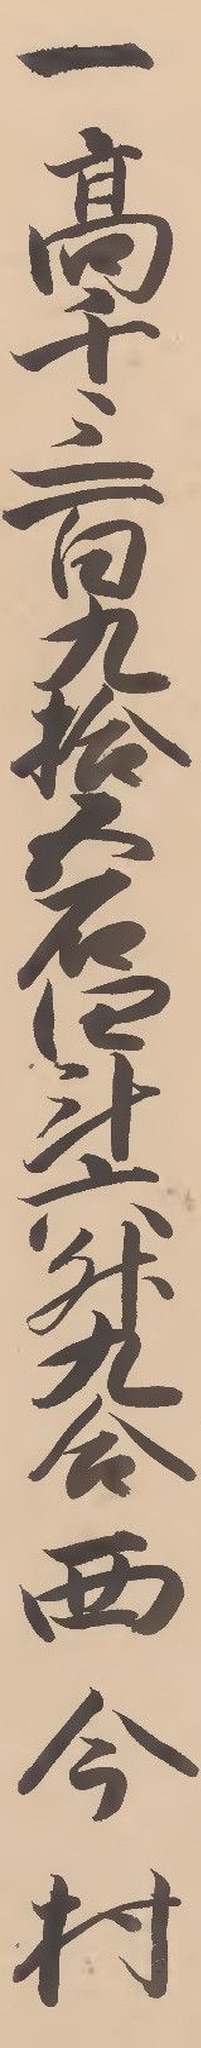一高千三百九拾五石四斗六升九合西今村
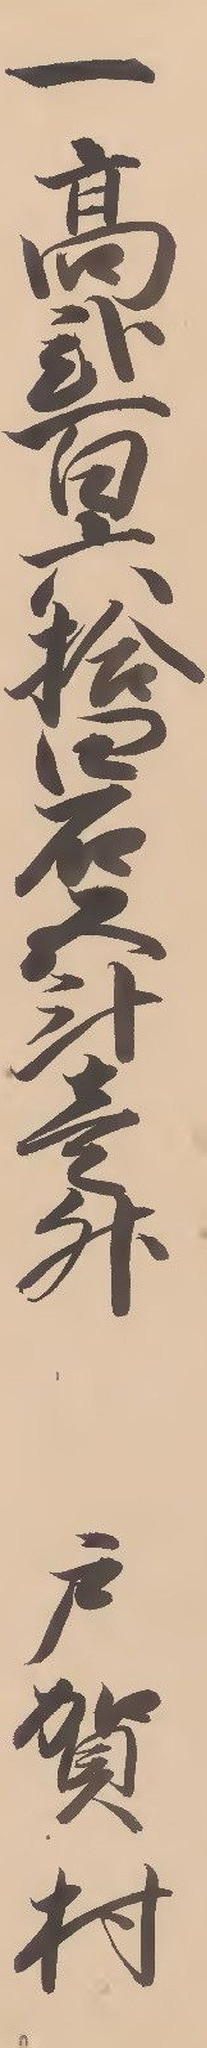一高弐百六拾四石五斗壱升戸賀村
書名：近江国郷帳
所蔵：国立公文書館 National Archives of Japan
